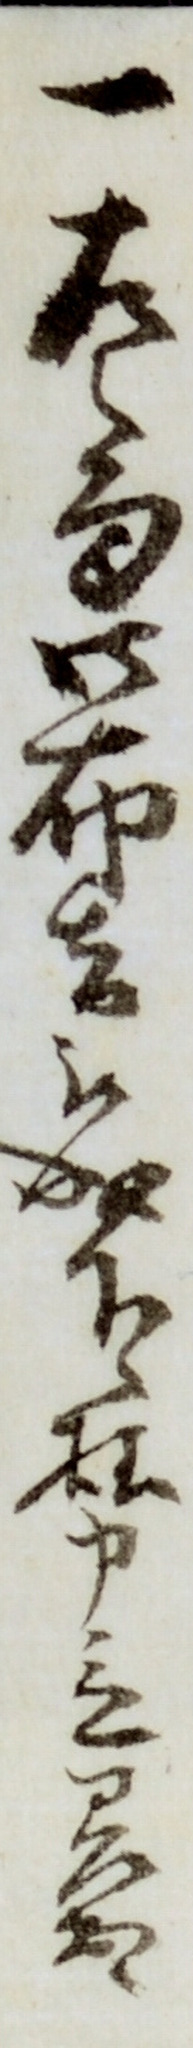一左之通御布告被成下候様申立差出候
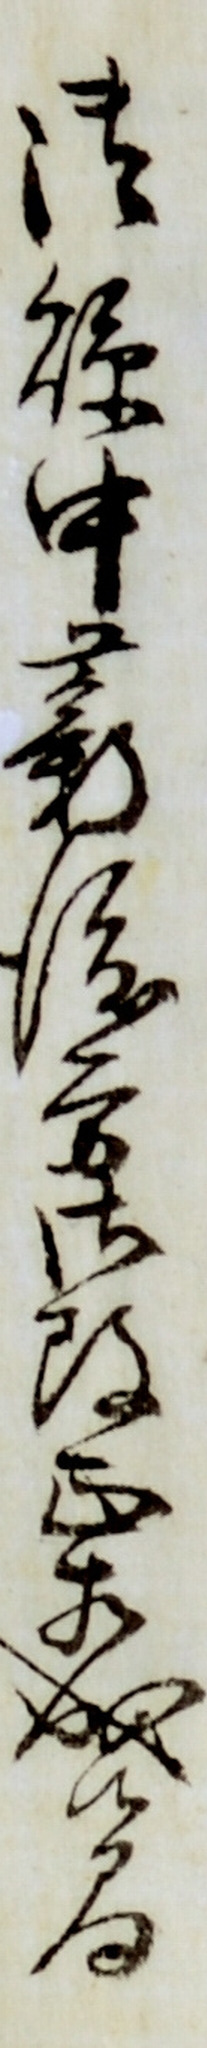御県中薪渡方御改正相成候間
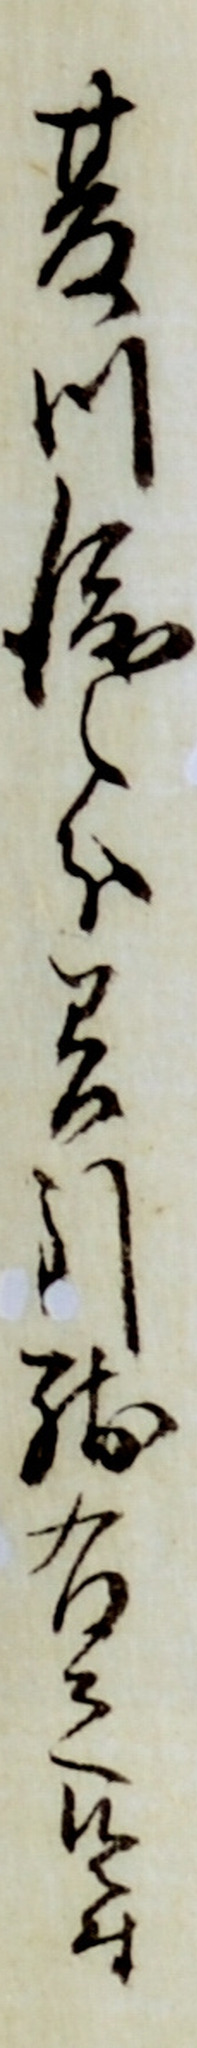夏川渡之分差引残有之候に付

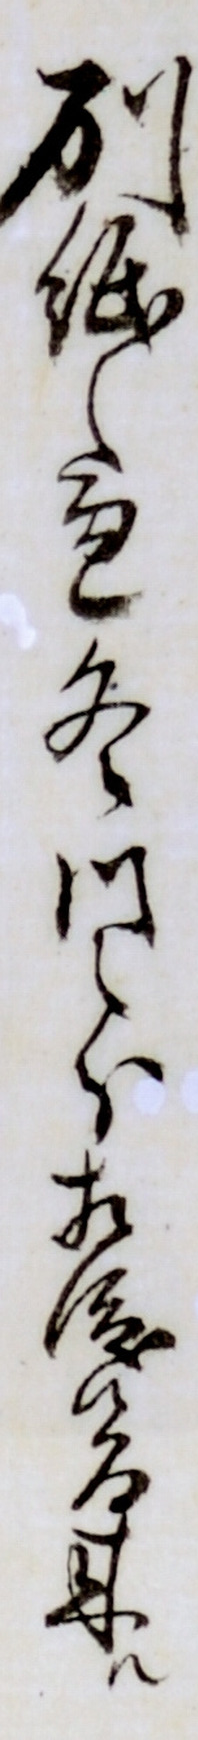別紙之通冬川之分相渡候間来ル
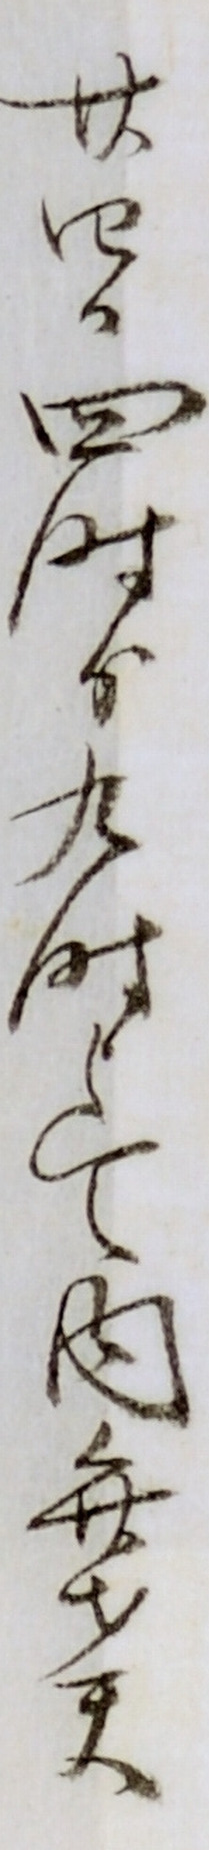廿四日四時ゟ九時迄之内弁財天
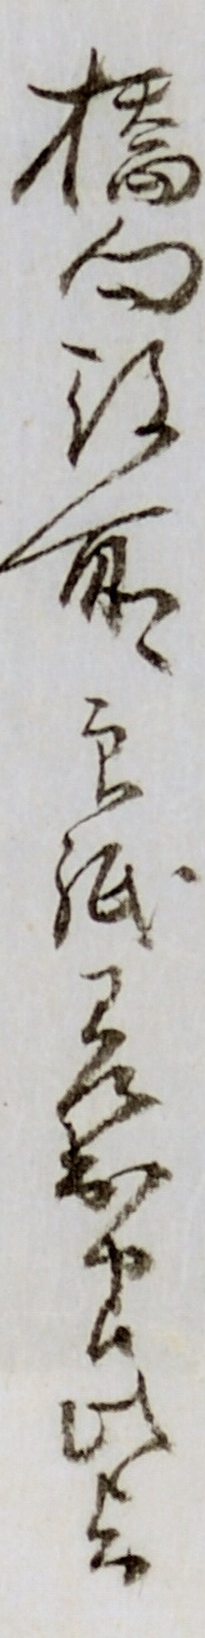橋向役所へ印紙差出申候此旨
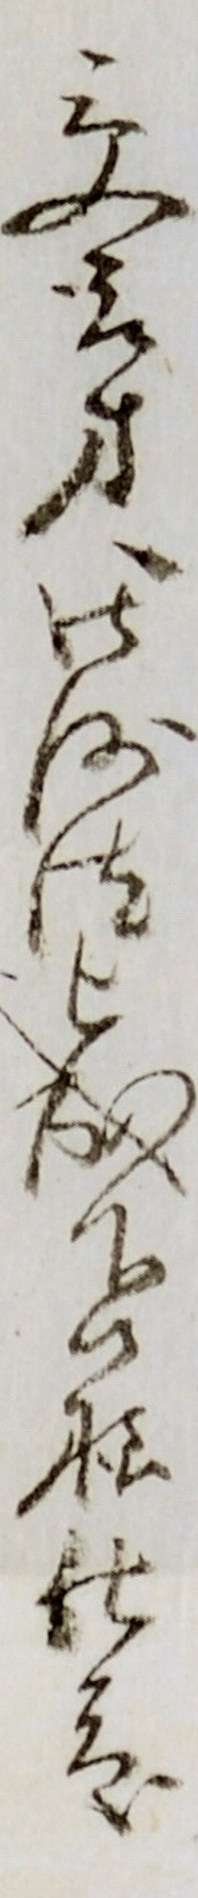受取方へ御沙汰被成下候様仕度
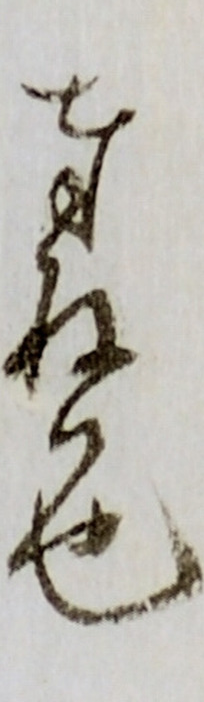奉存候也
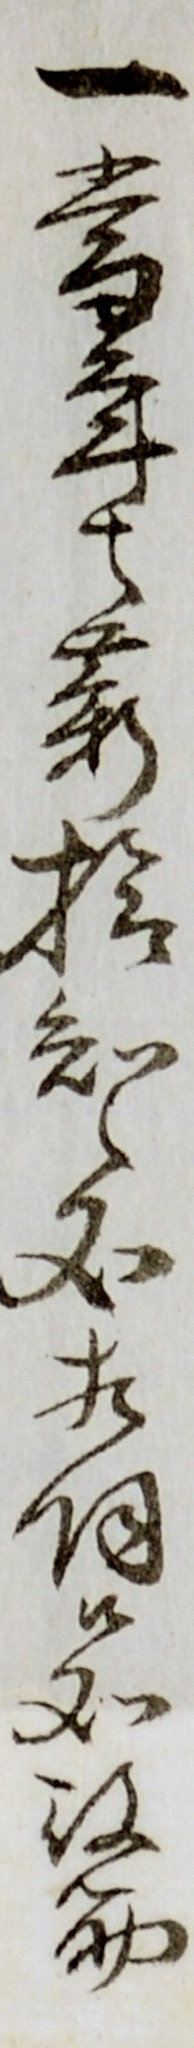一当年は薪検知之処相伺候処役筋
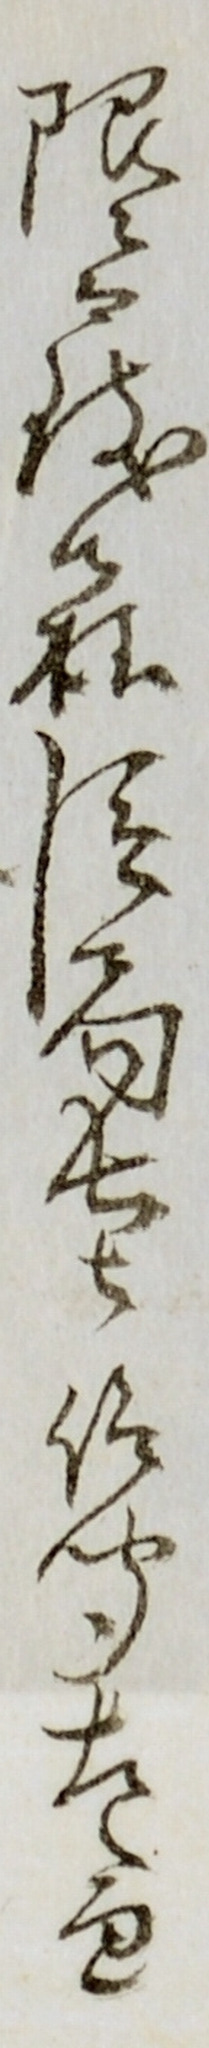限にて致候様従局長被仰聞左之通
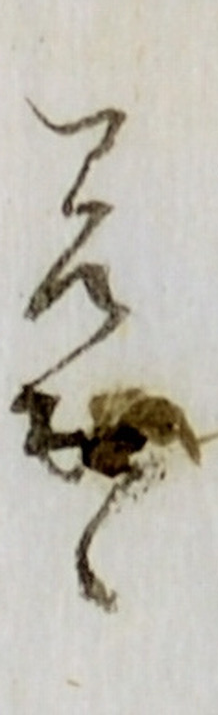差出候
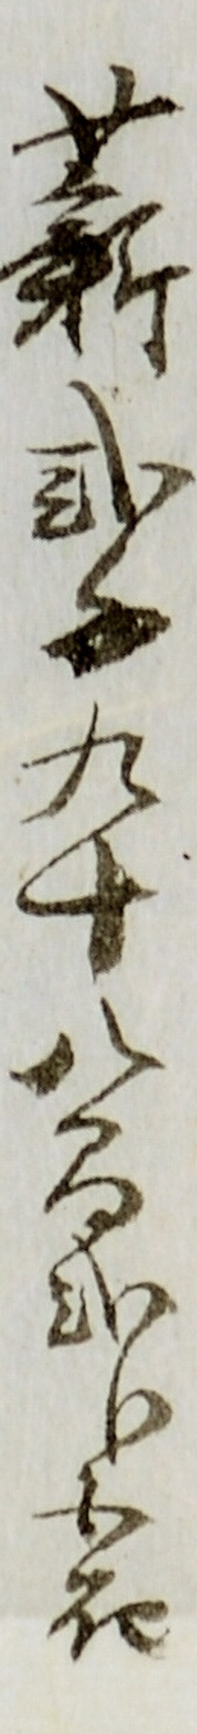薪弐千九十八間弐分五厘
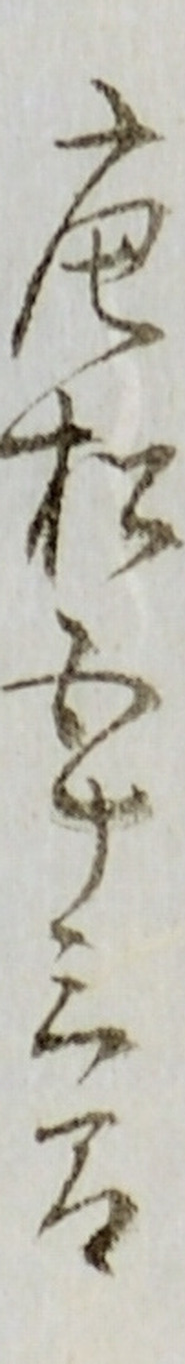唐松五十三間
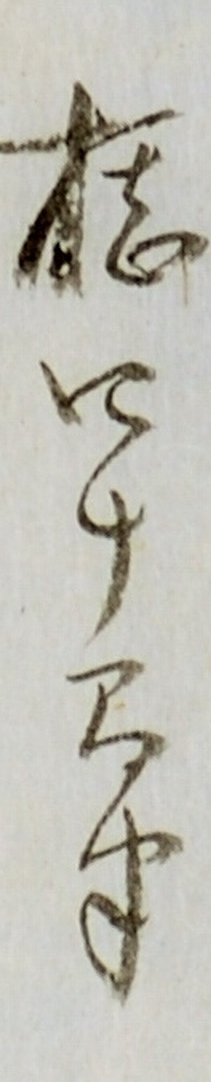椹四十間半
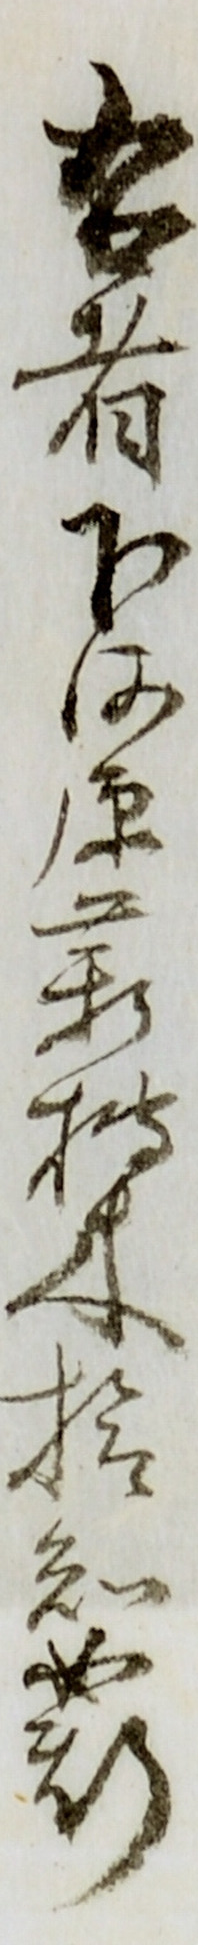右は下河原薪榑木検知如斯
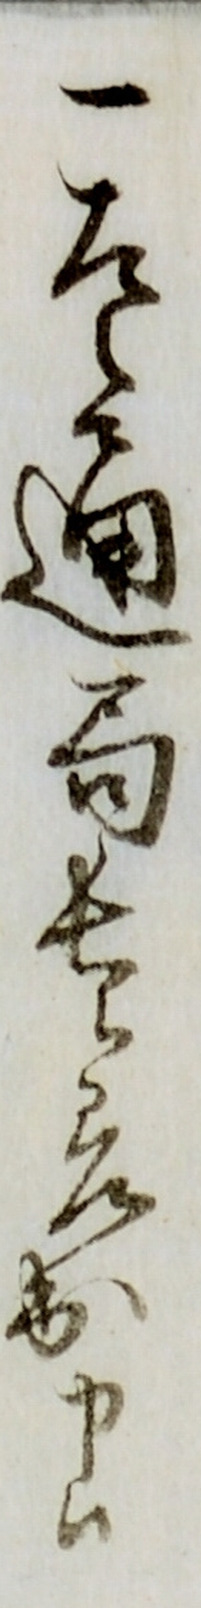一左之通局長え差出申候
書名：山林方諸事御用留
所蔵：伊那市立高遠町図書館・合同会社AMANE
